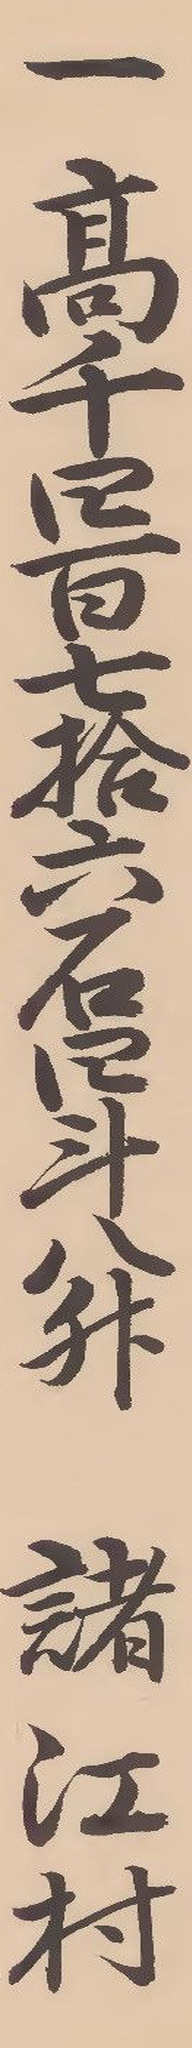一高千四百七拾六石四斗八升諸江村
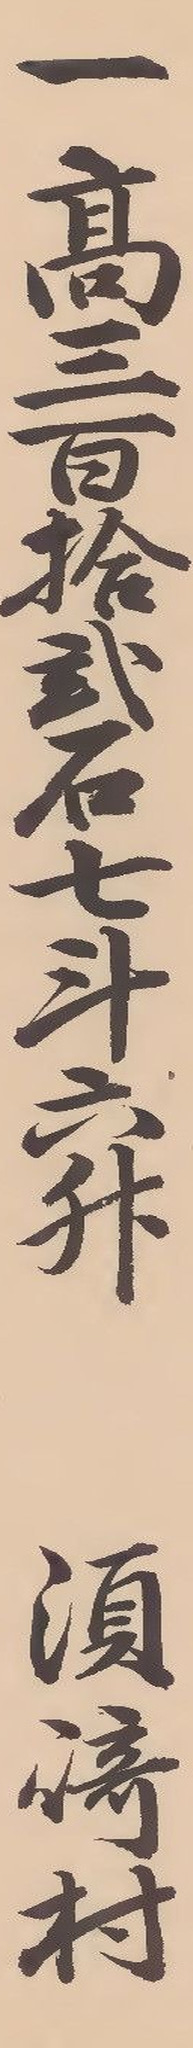一高三百拾弐石七斗六升須崎村

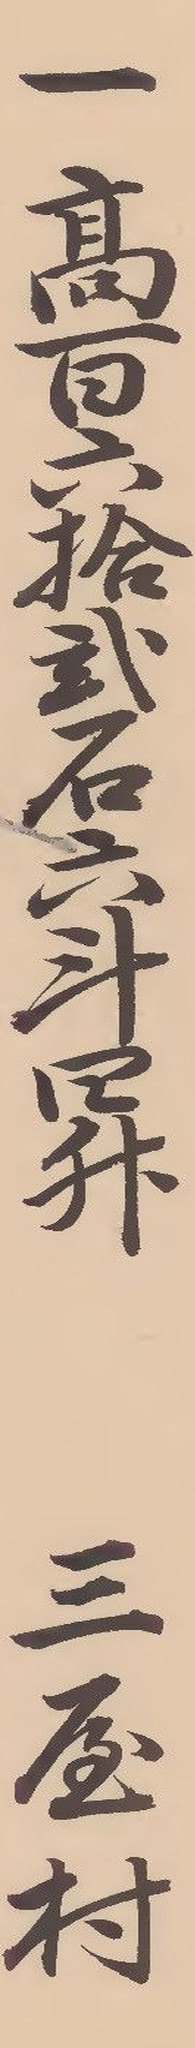一高百六拾弐石六斗四升三屋村
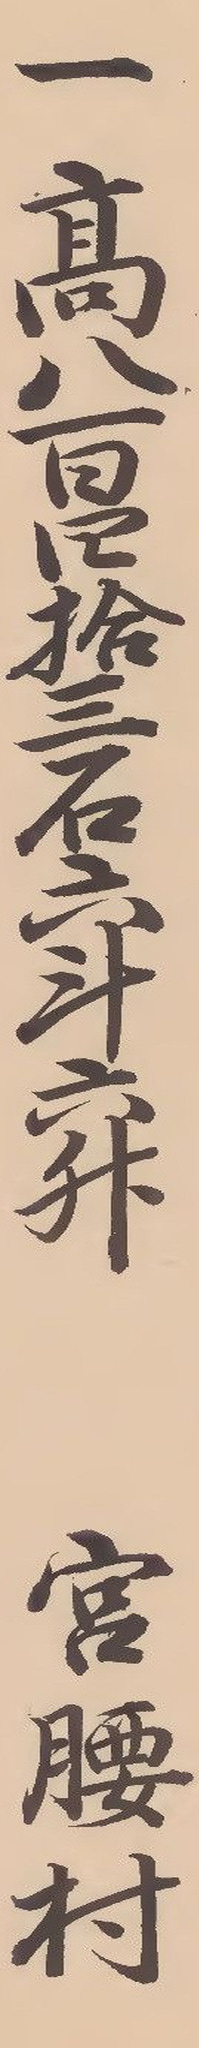一高八百四拾三石六斗六升宮腰村
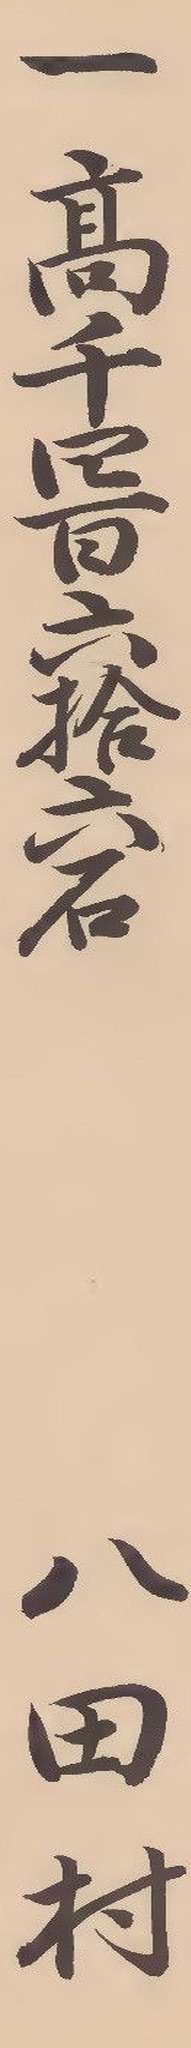一高千四百六拾六石八田村
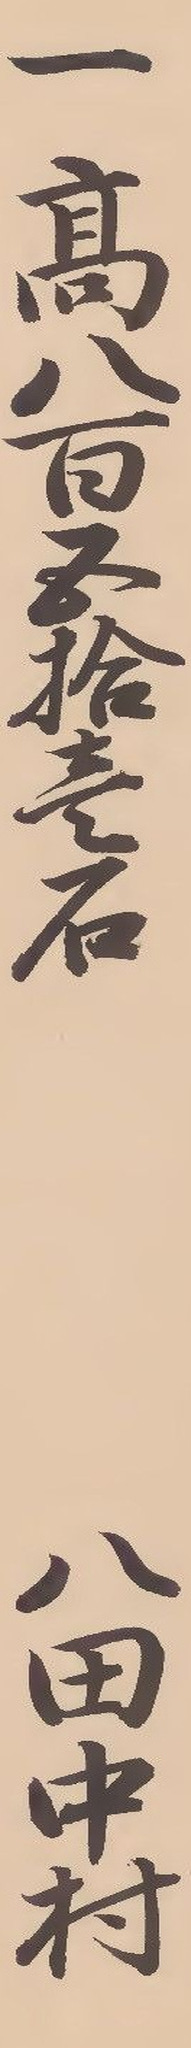一高八百五拾壱石八田中村
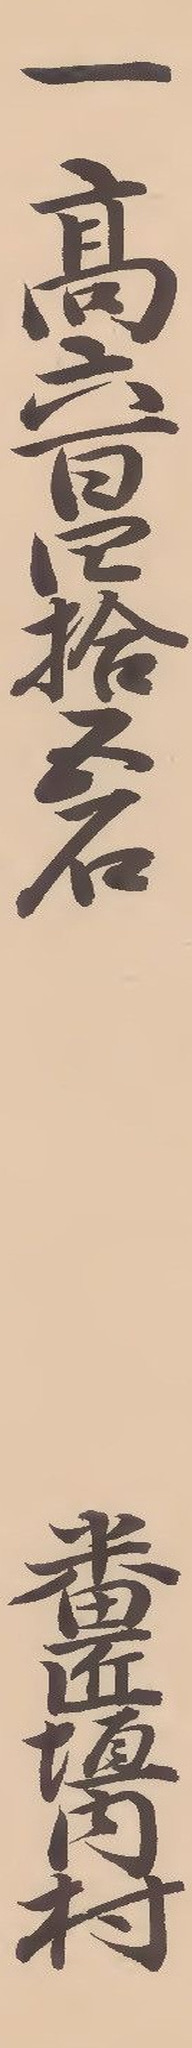一高六百四拾五石番匠垣内村
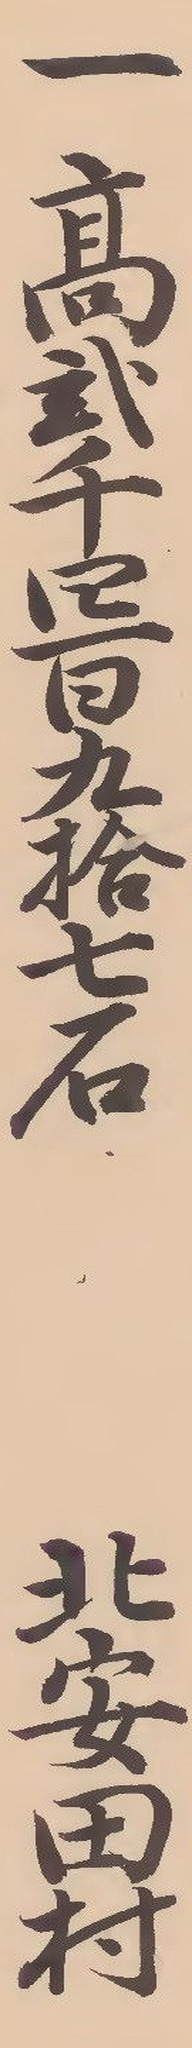一高弐千四百九拾七石北安田村

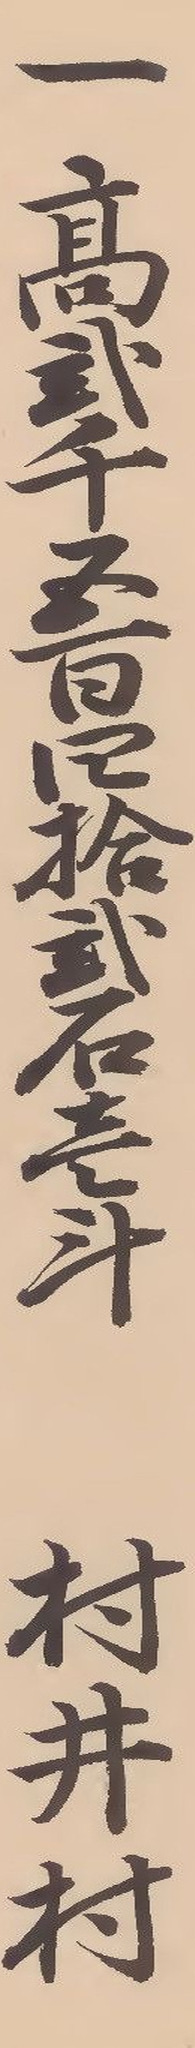一高弐千五百四拾弐石壱斗村井村
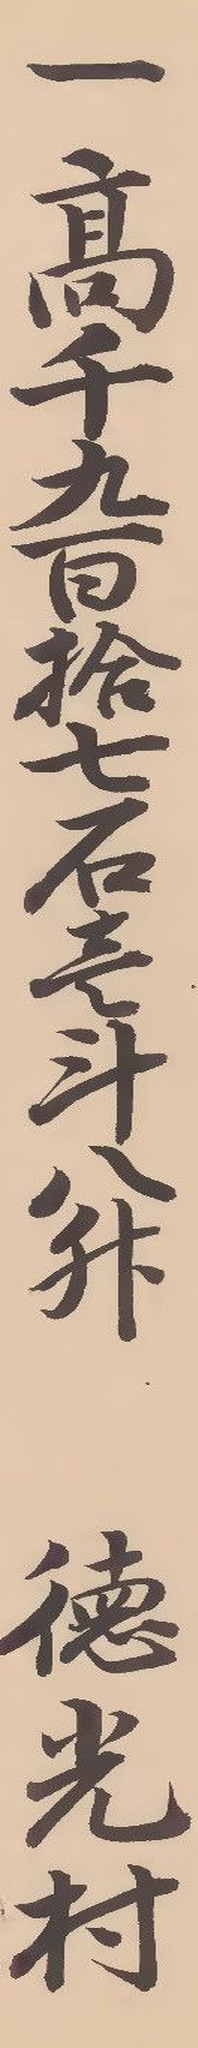一高千九百拾七石壱斗八升徳光村
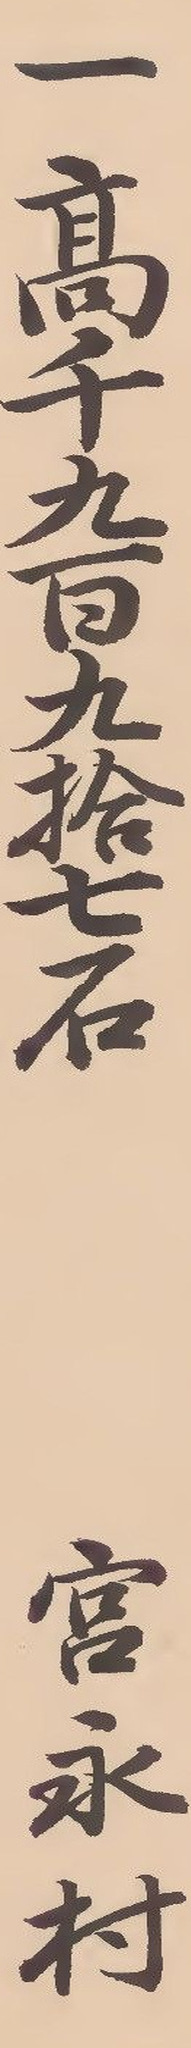一高千九百九拾七石宮永村
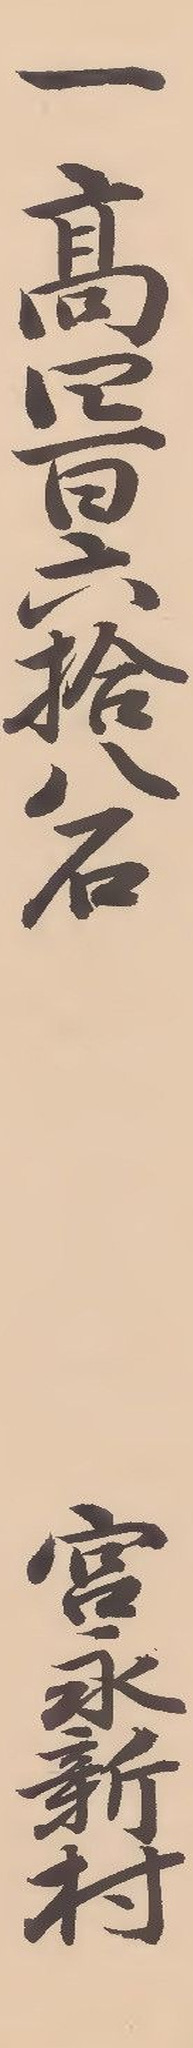一高四百六拾八石宮永新村
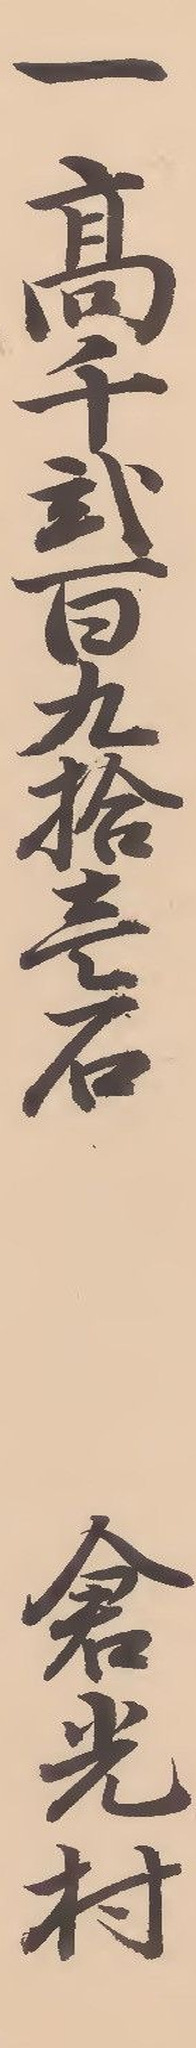一高千弐百九拾壱石倉光村

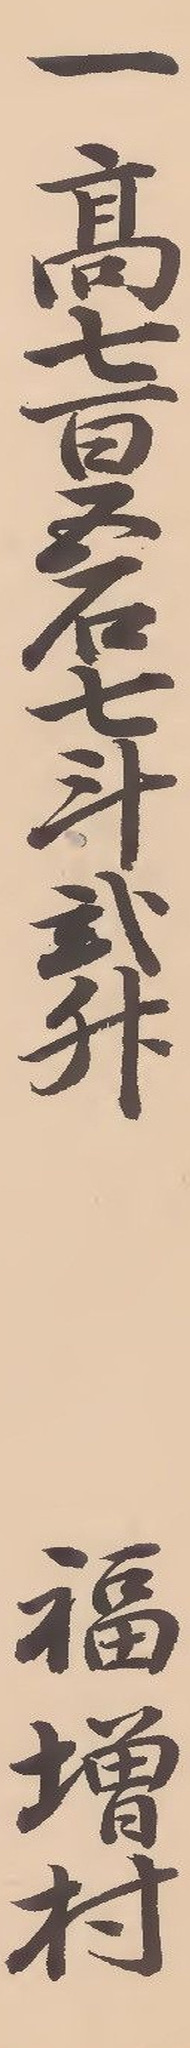一高七百五石七斗弐升福増村
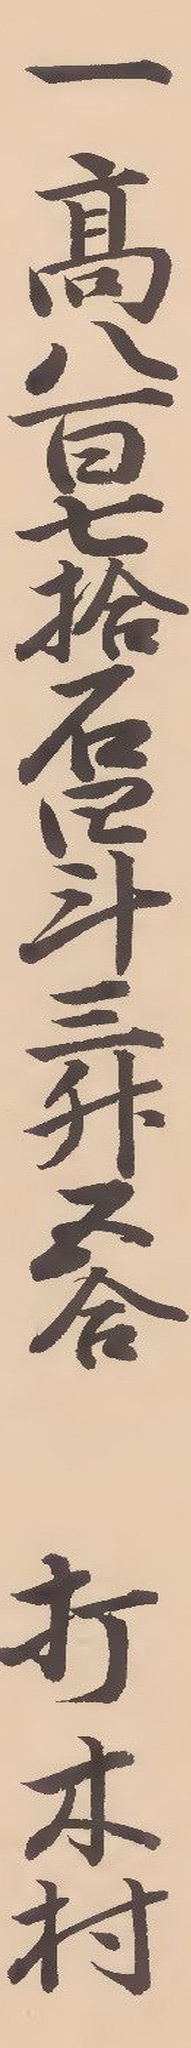一高八百七拾石四斗三升五合打木村
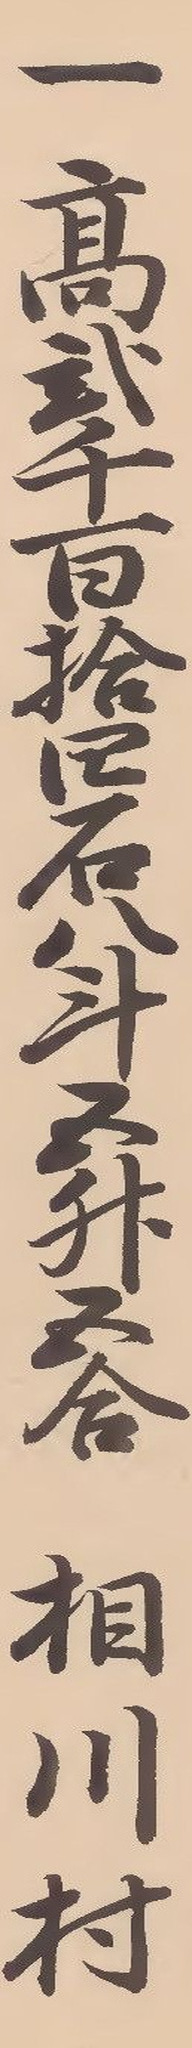一高弐千百拾四石八斗五升五合相川村
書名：加賀国郷帳
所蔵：国立公文書館 National Archives of Japan
